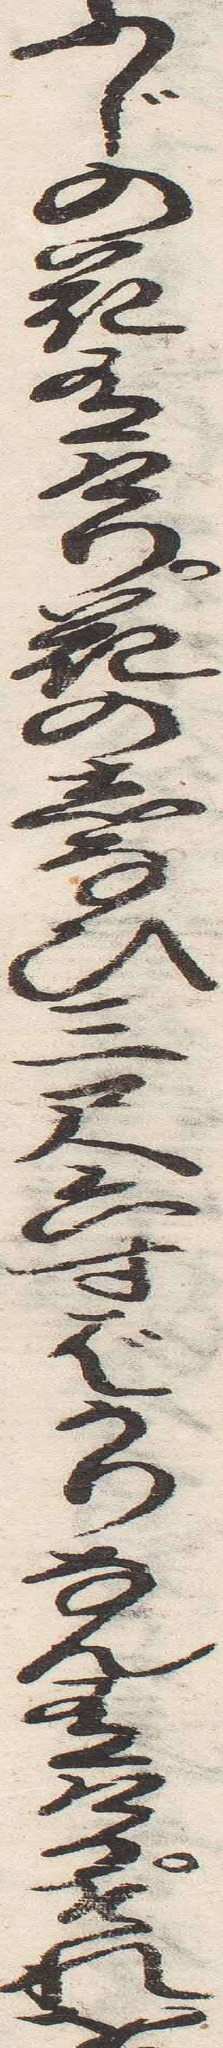ふじの花有けり。花のしなひ三尺六寸ばかりなん有ける。それを
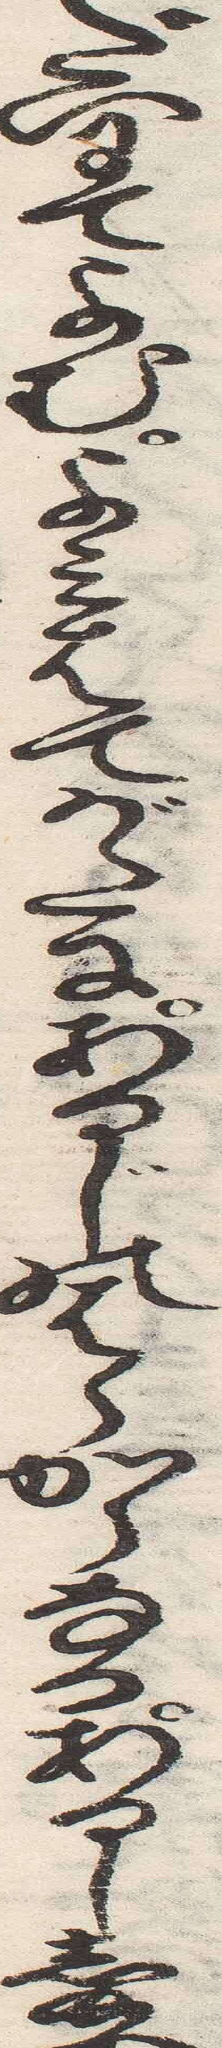だいにてよむ。よみはてがたに。あるじのはらからなる。あるしし給ふ
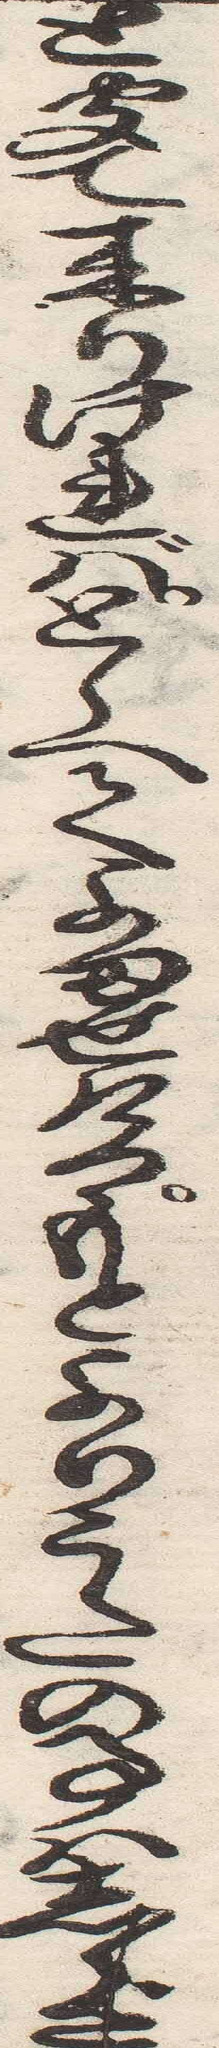と聞て来りければ。とらへてよませける。もとよりうたの事はしらざ
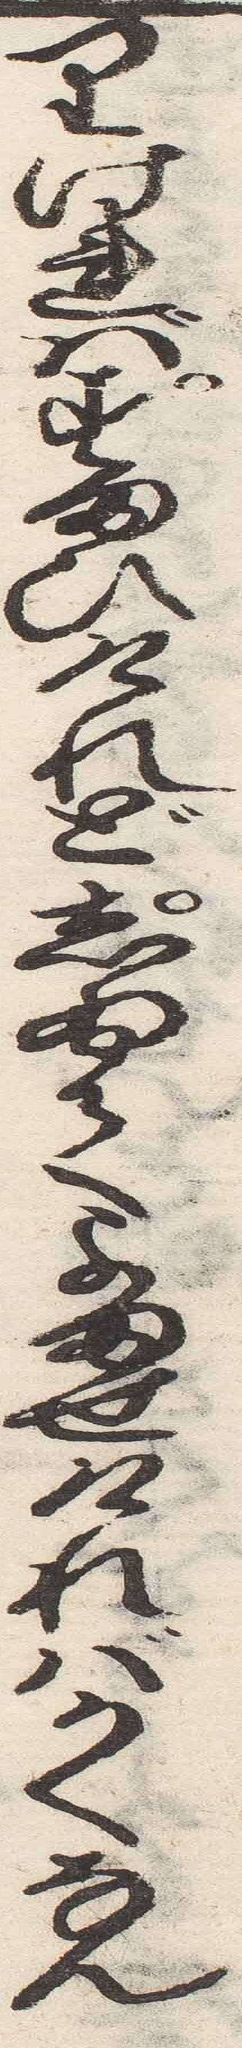りければ。すまひけれど。しゐてよませければかくなん
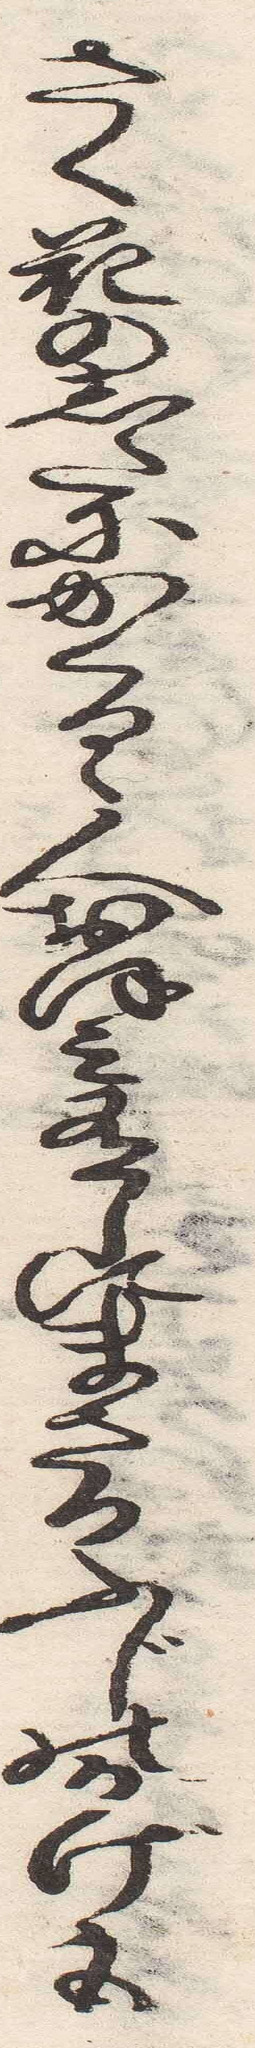さく花のしたにかくるゝ人おほみ有しにまさるふじのかげかも
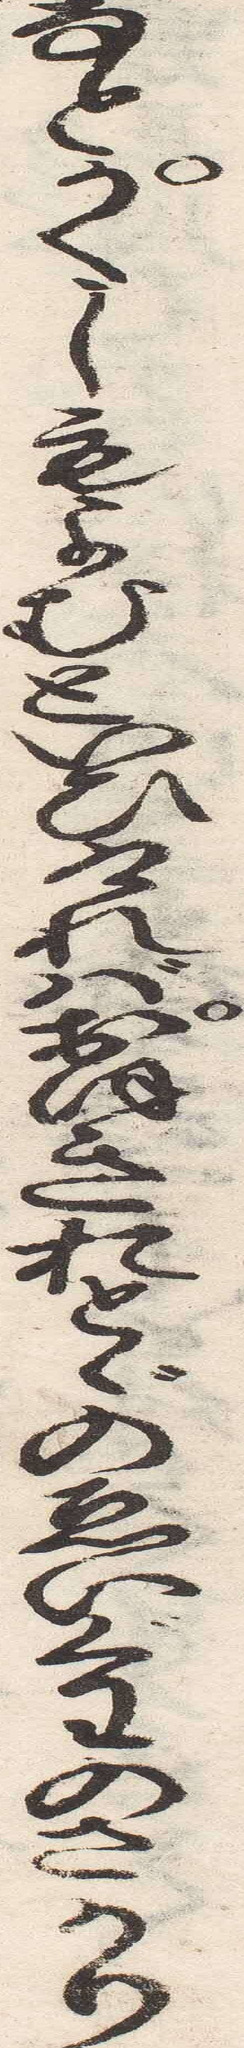なと。かくしもよむといひければ。おほきおとゞのゑいぐわのさかり
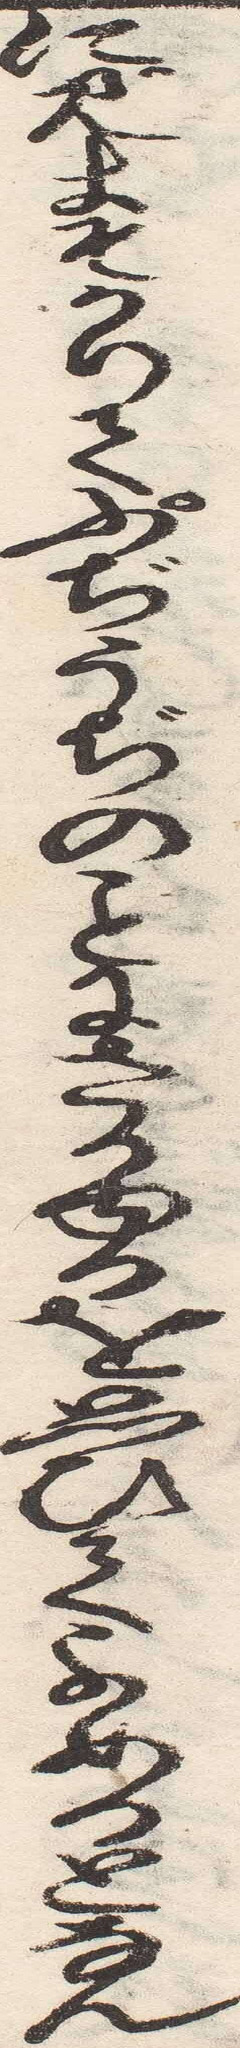にみまそかりて。ふぢうぢのことにさかゆるを思ひてよめるとなん
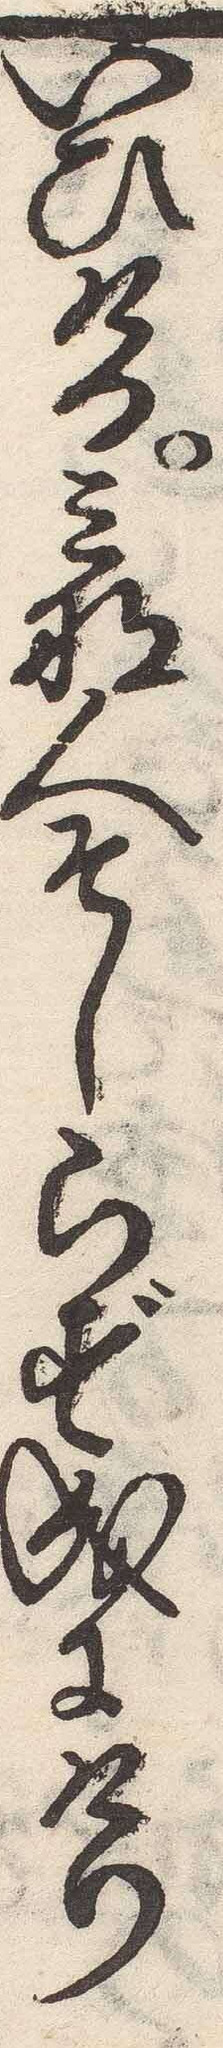いひける。みな人そしらず成にけり
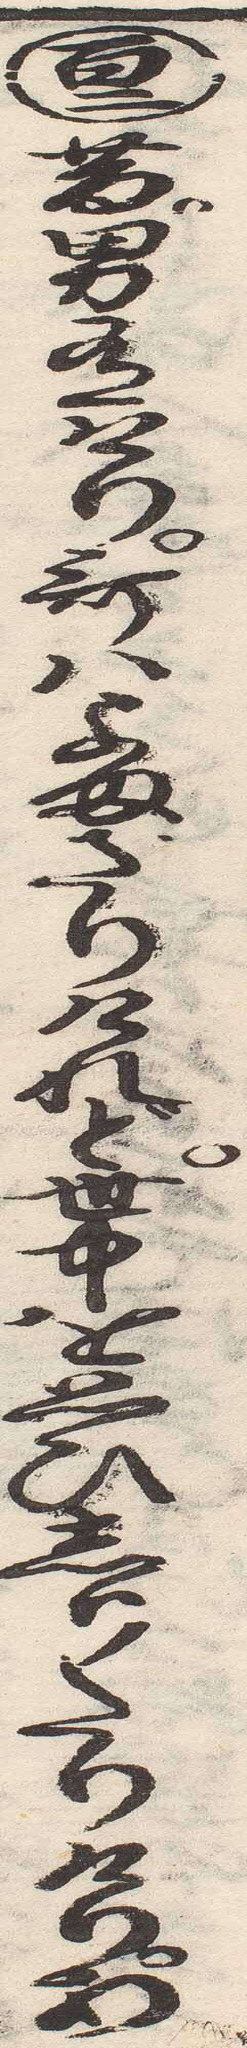百二昔。男有けり。哥はよまざりけれど。世[の]中を思ひしりたりけり。あ
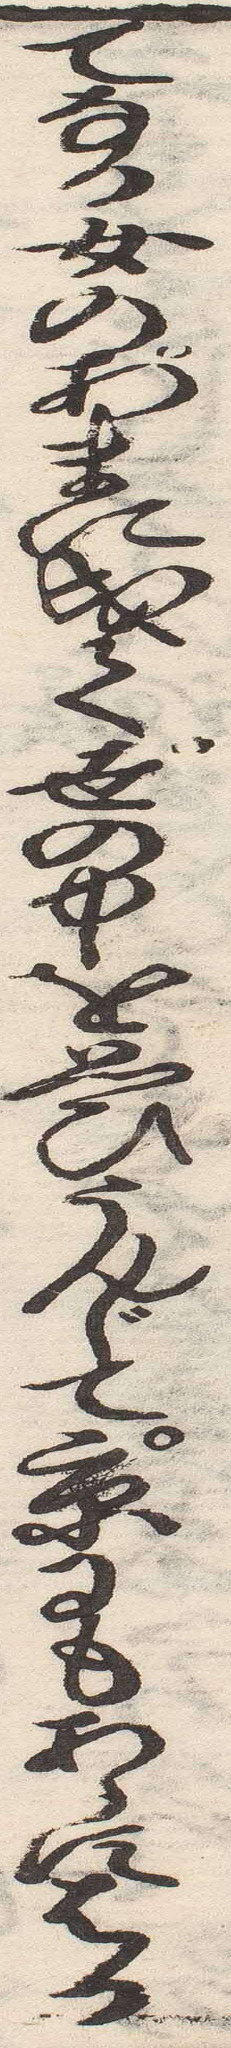てなる女の。あまに成て。世の中を思ひうんじて。京にもあらすはる
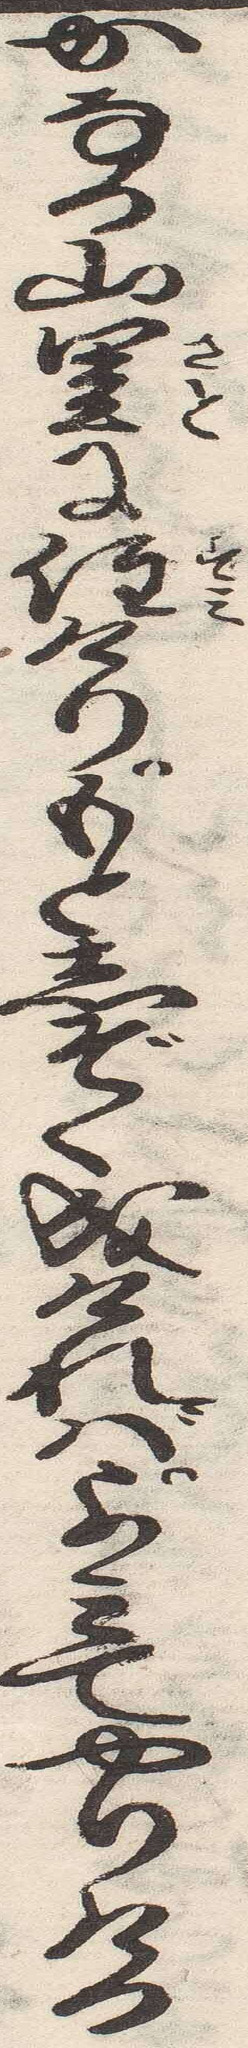かなる山里に住けり。もとしぞく成ければ。よみてやりける
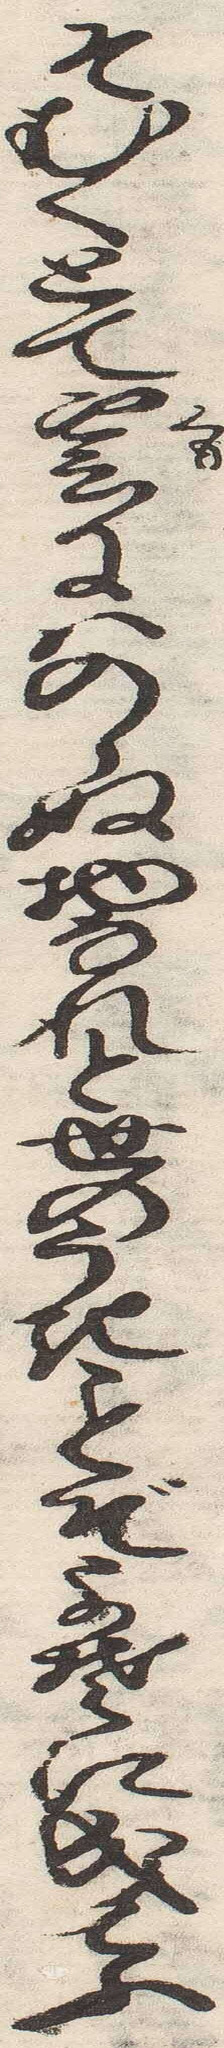そむくとて雲にはのらぬ物なれと世のうきことぞよそに成てふ
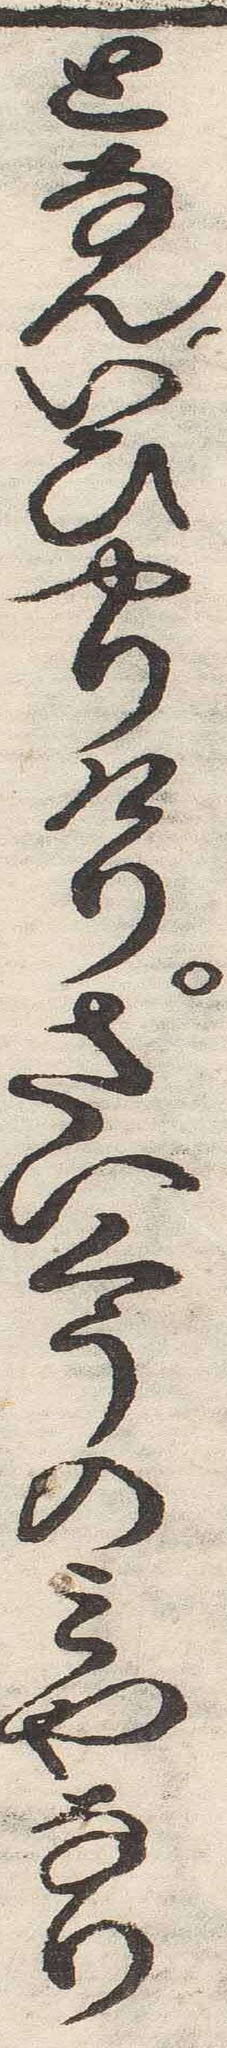となん。いひやりけり。さいくうのみやなり
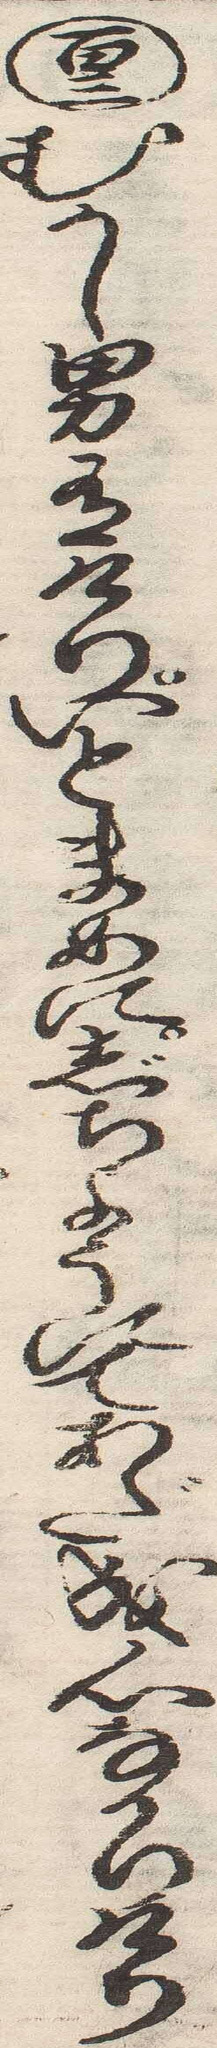百三むかし男有けり。いとまめに。じちようにてあだ成心なかりけり
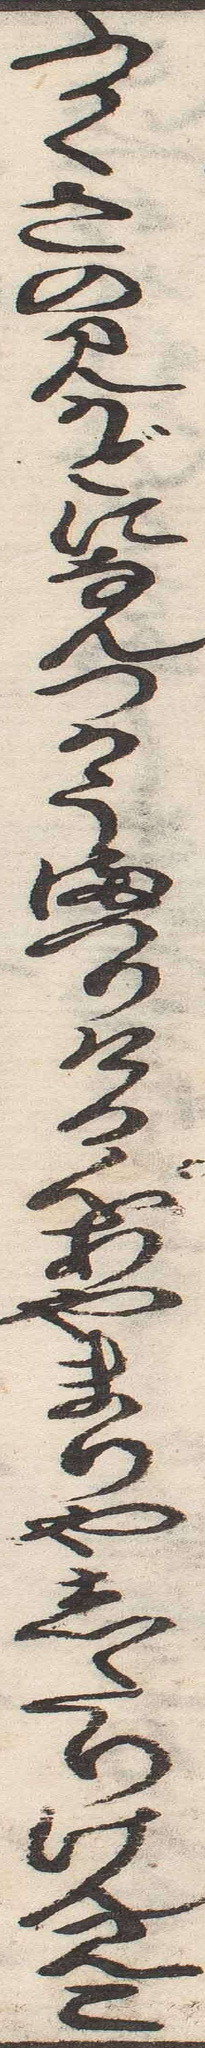ふかくさのみかどになんつかうまつりける。心あやまりやしたりけんみこ
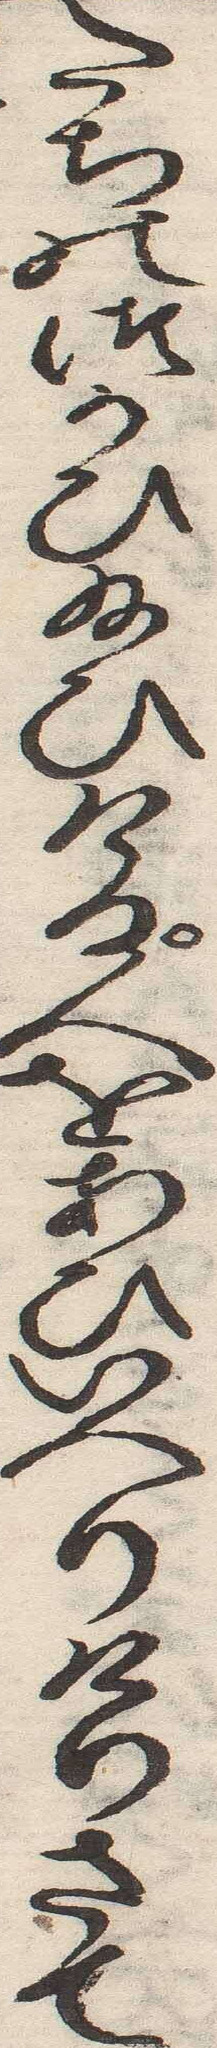たちのつかひ給ひける。人をあひいへりけりさて
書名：伊勢物語
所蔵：東京学芸大学附属図書館 国文学研究資料館
